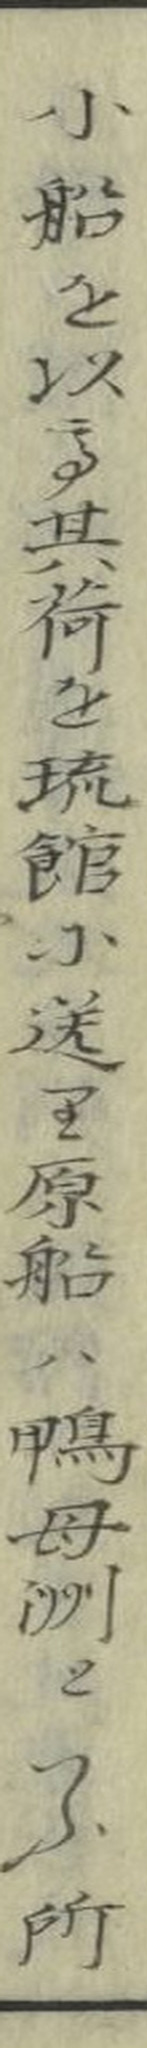小船を以て其荷を琉館に送り原船は鴨母洲といふ所

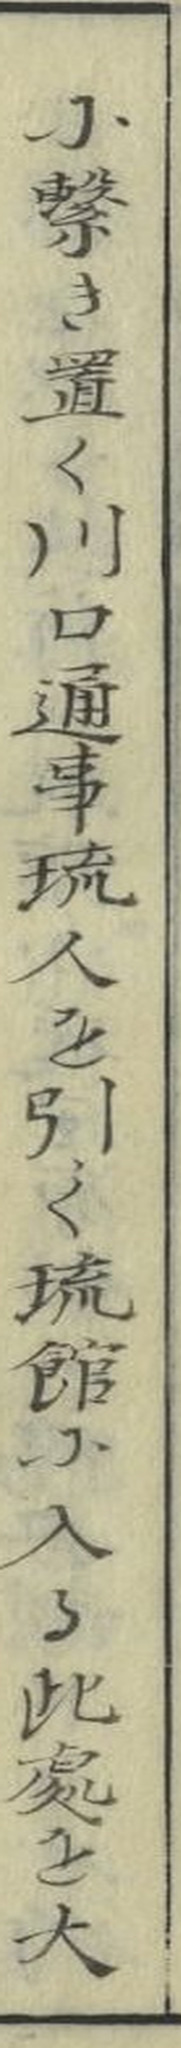に繋き置く川口通事琉人を引て琉館に入る此処を大
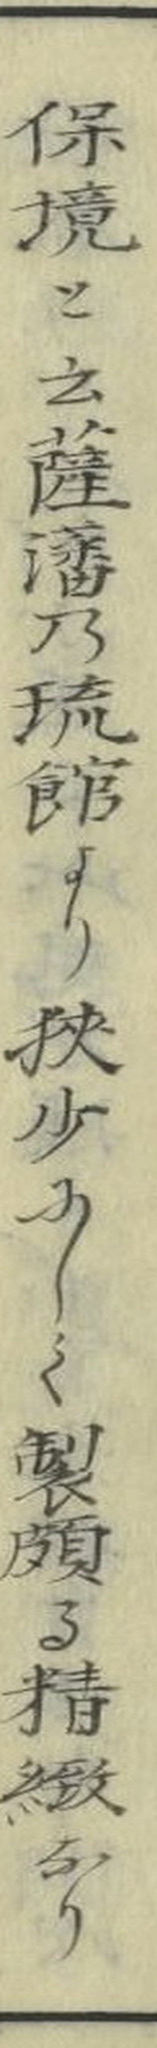保境と云薩藩の琉館より狭小にして製頗る精緻なり
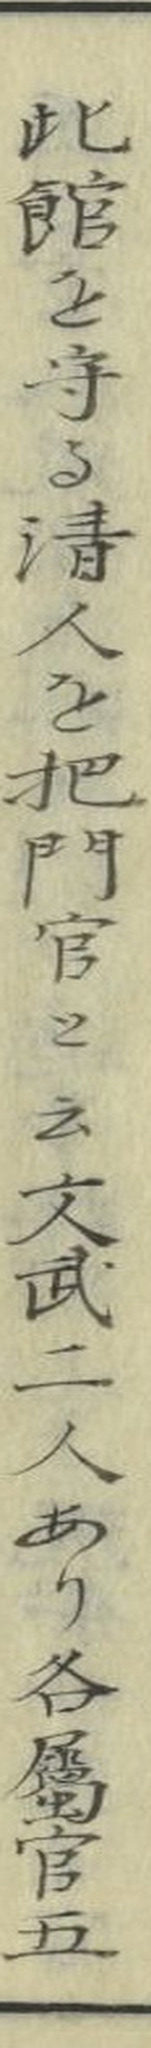此館を守る清人を把門官と云文武二人あり各属官五
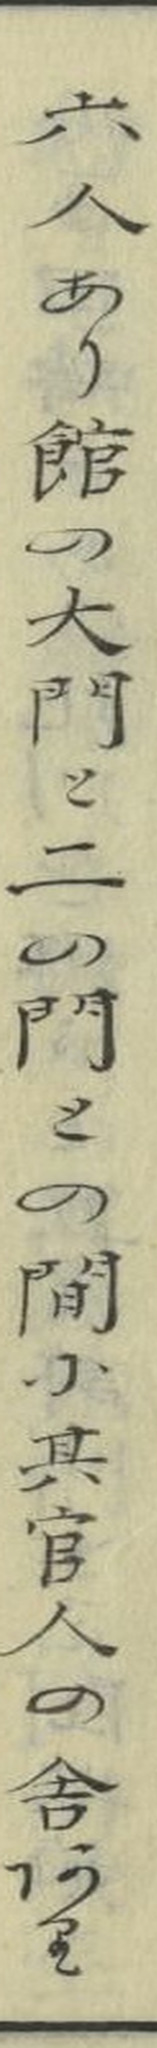六人あり館の大門と二の門との間に其官人の舎あり
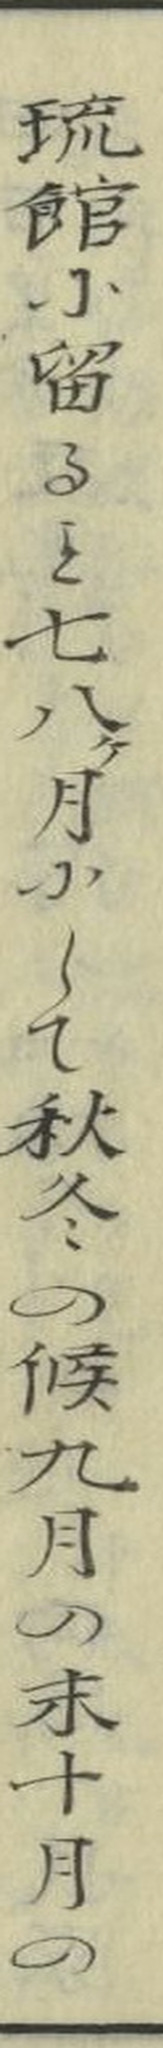琉館に留ること七八ヶ月にして秋冬の候九月の末十月の
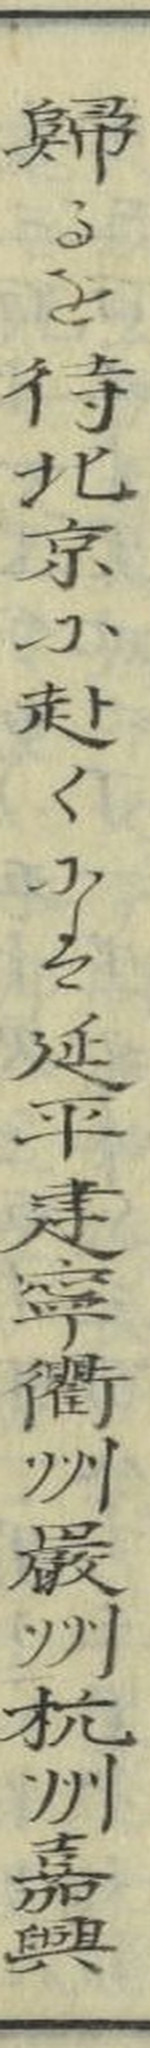帰るを待北京に赴くには延平建寧衢州厳州杭州嘉興
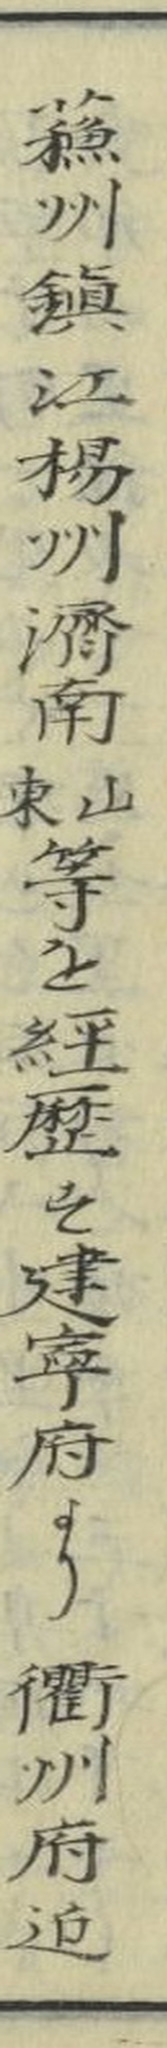蘓州鎮江楊州濟南山東等を経歴す建寧府より衢州府迄
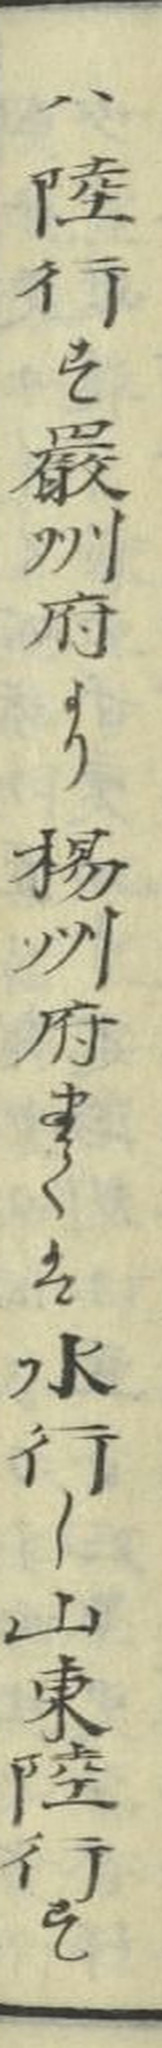は陸行す厳州府より楊州府まては水行し山東陸行す
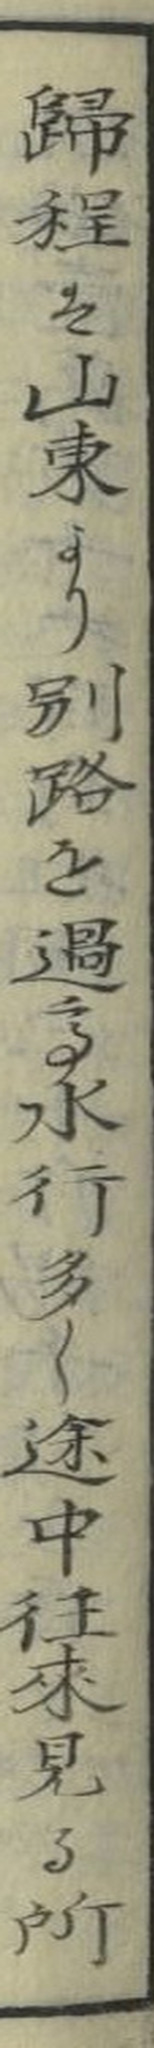帰程は山東より別路を過て水行多し途中往来見る所
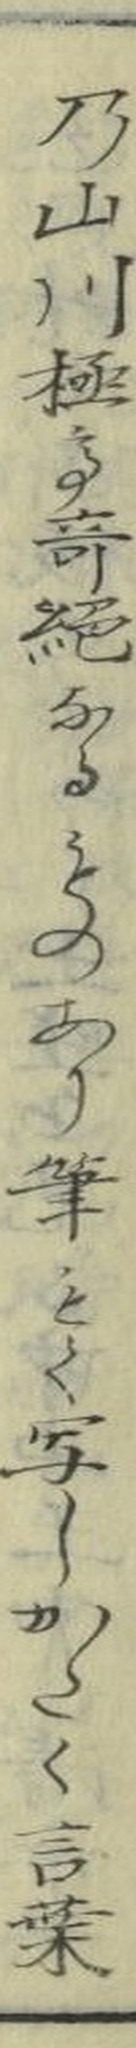の山川極て奇絶なるものあり筆もて写しかたく言葉
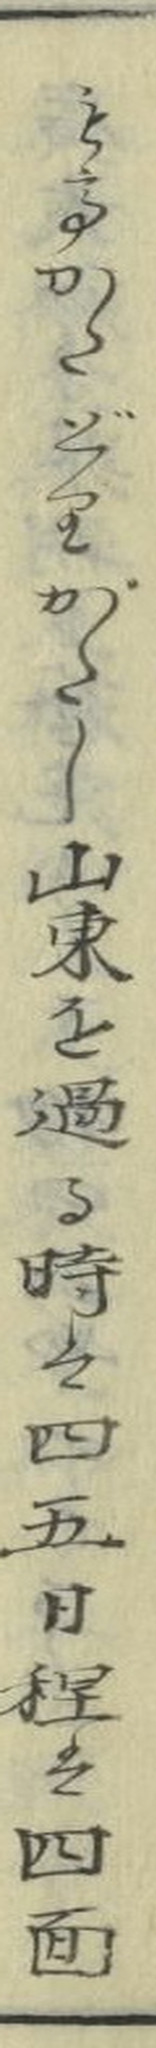もてかたどりがたし山東を過る時は四五日程は四面
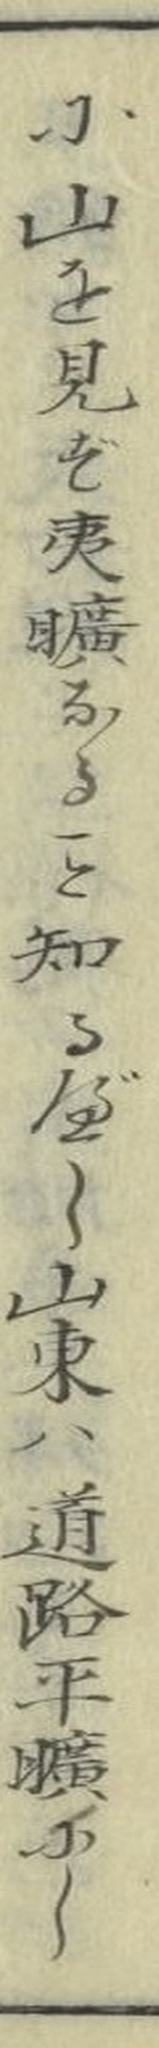に山を見ず夷曠なること知るべし山東は道路平曠にし
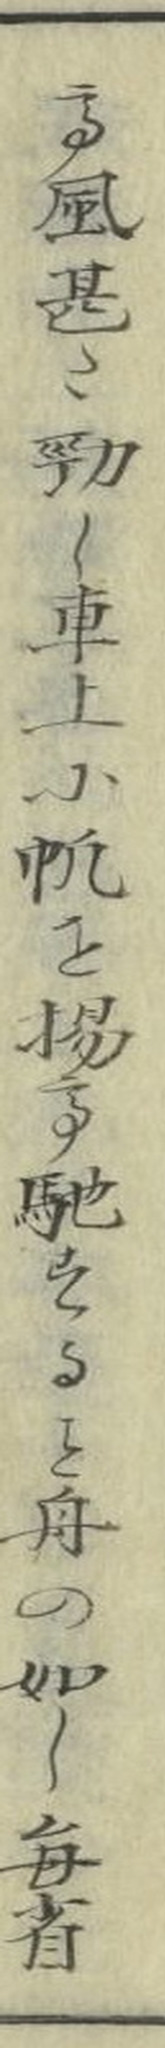て風甚た勁し車上に帆を揚て馳すること舟の如し毎省
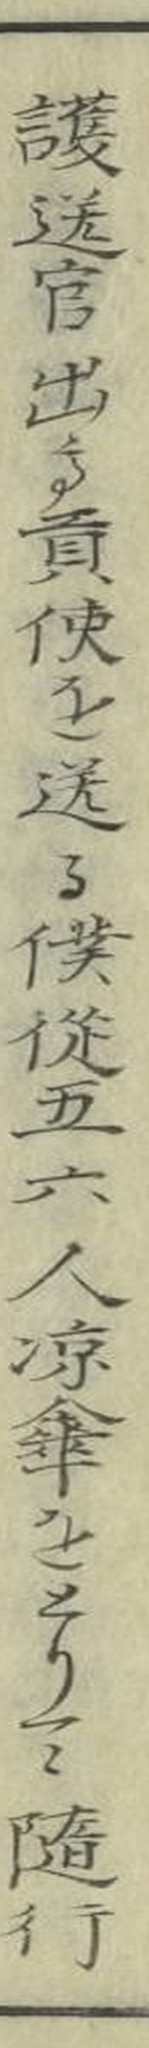護送官出て貢使を送る僕従五六人凉傘をとりて随行
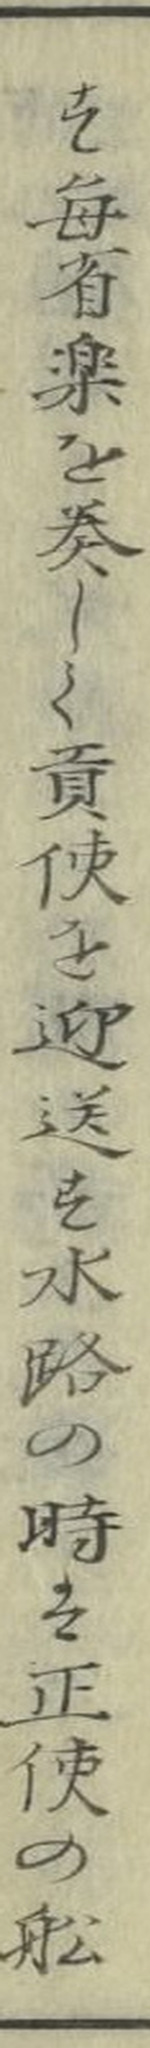す毎省楽を奏して貢使を迎送す水路の時は正使の舩
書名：琉球沿革志 下
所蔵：University of the Ryukyus Library
